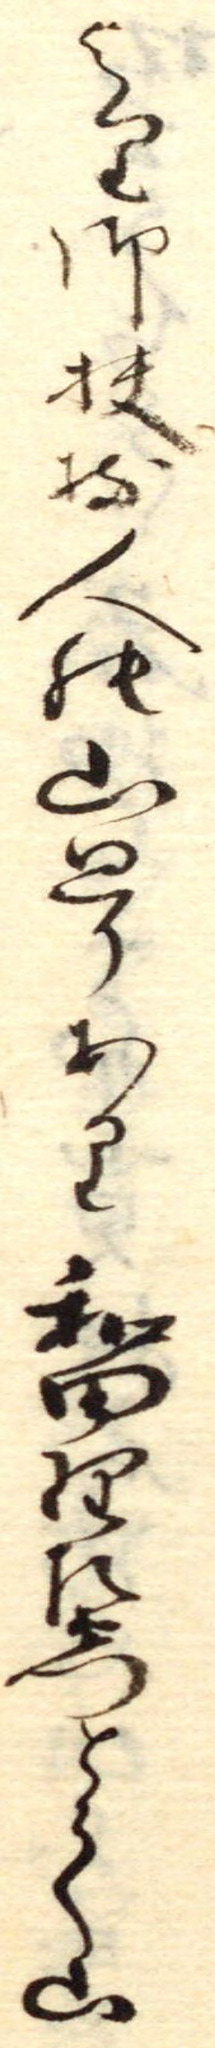より御扶持人の山廻りあり和田理左衛門とて山
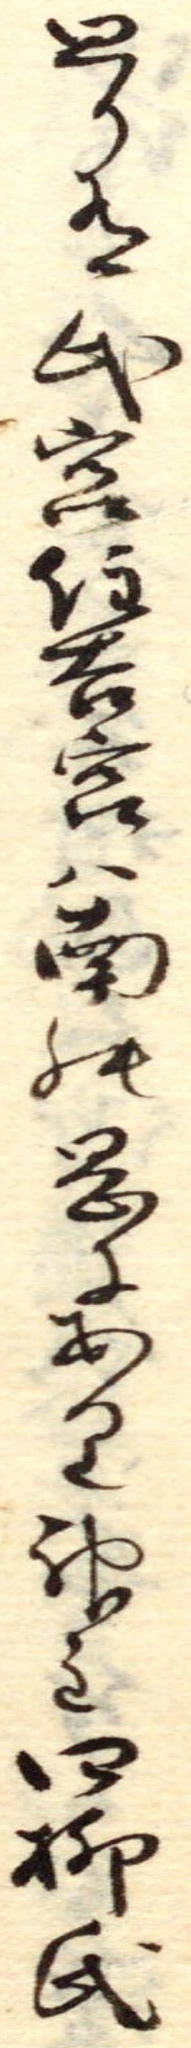廻り有氏宮住吉宮は南の岡にあり神主四柳氏
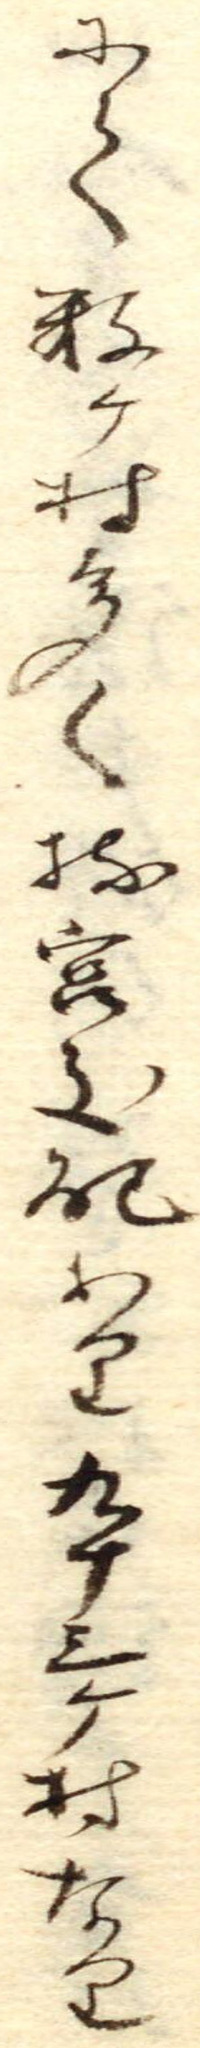にて数ヶ村多く持宮支配あり九十三ヶ村なり
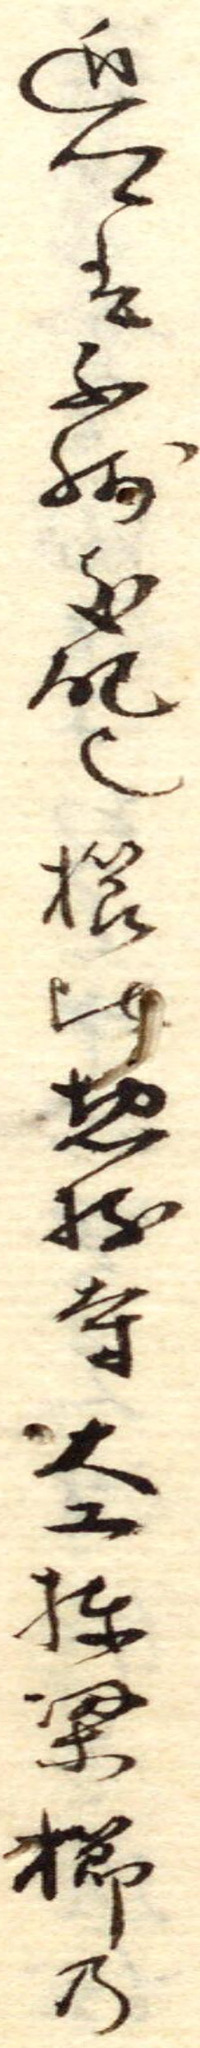近郷は不残支配也櫛比惣持寺大工棟梁櫛の
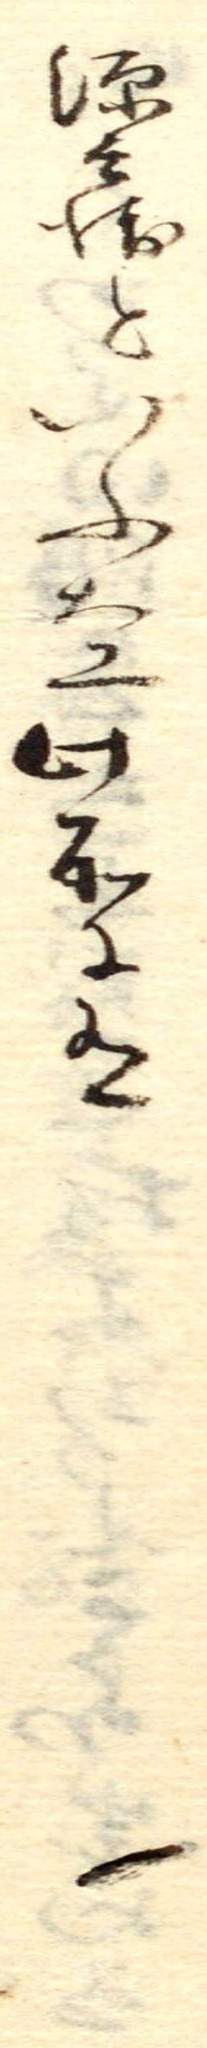源兵衛といふ大工此所に有
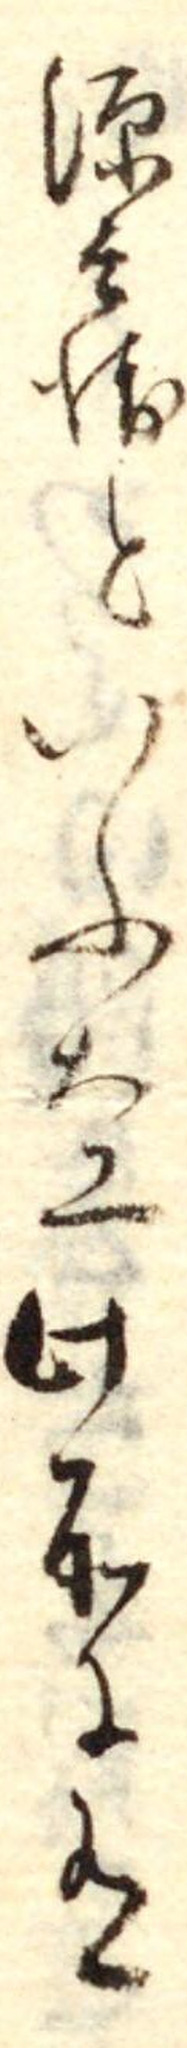源兵衛といふ大工此所に有
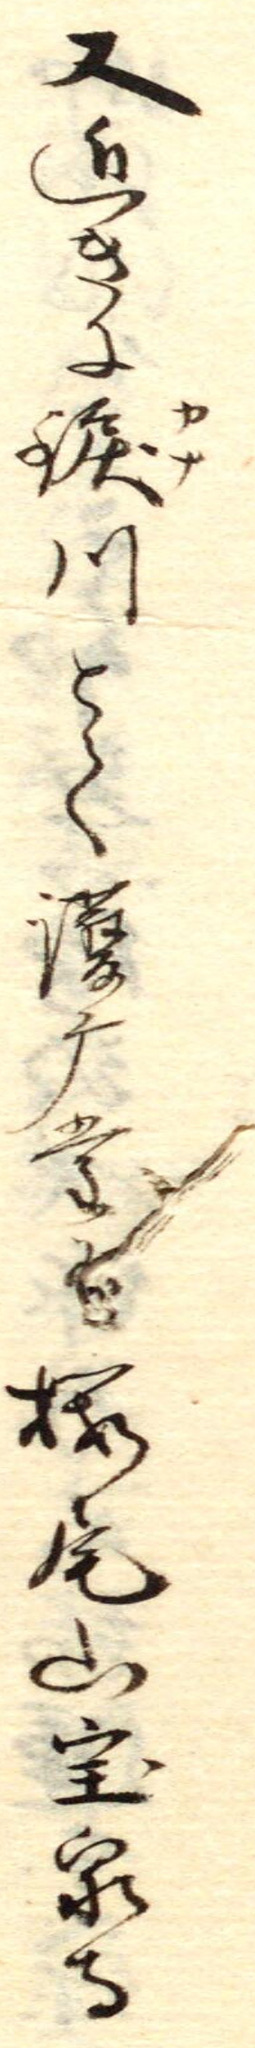又近きに錑川とて護摩堂有桜尾山宝泉寺
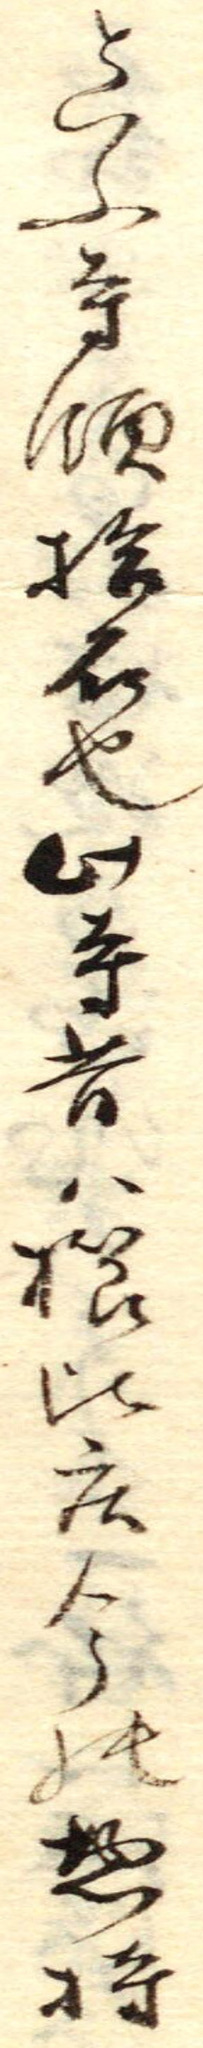といふ寺領拾石也此寺昔は櫛比庄今の惣持
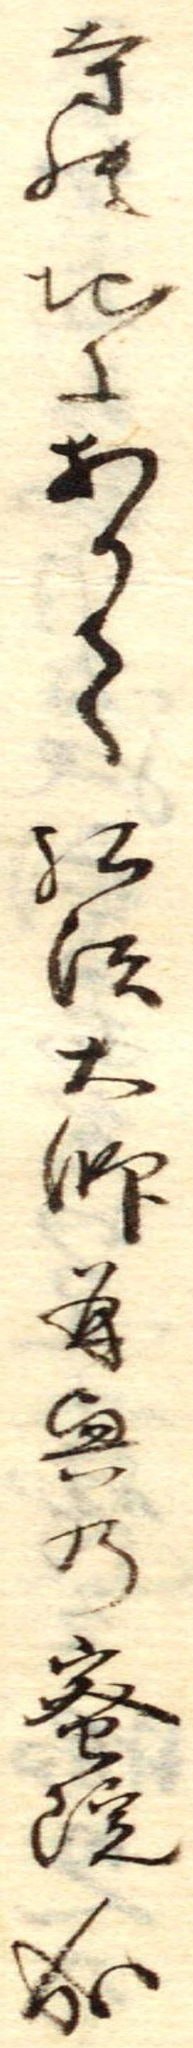寺の地にありて弘法大師再興の蜜院成
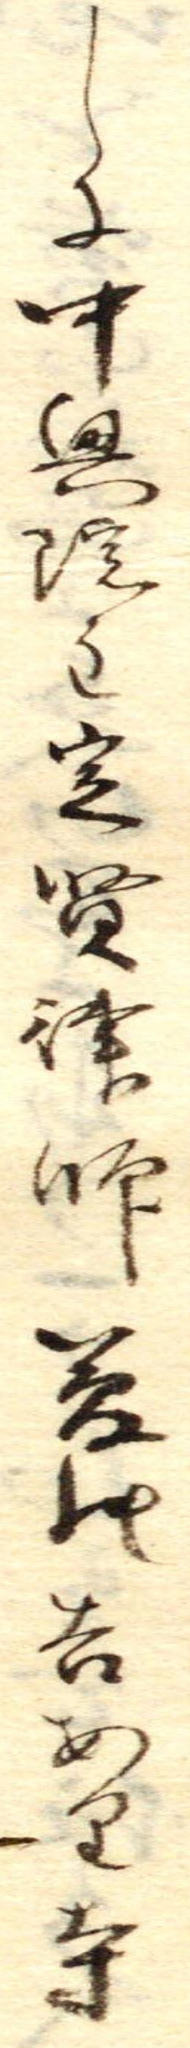しに中興院主定賢律師夢の告あり寺

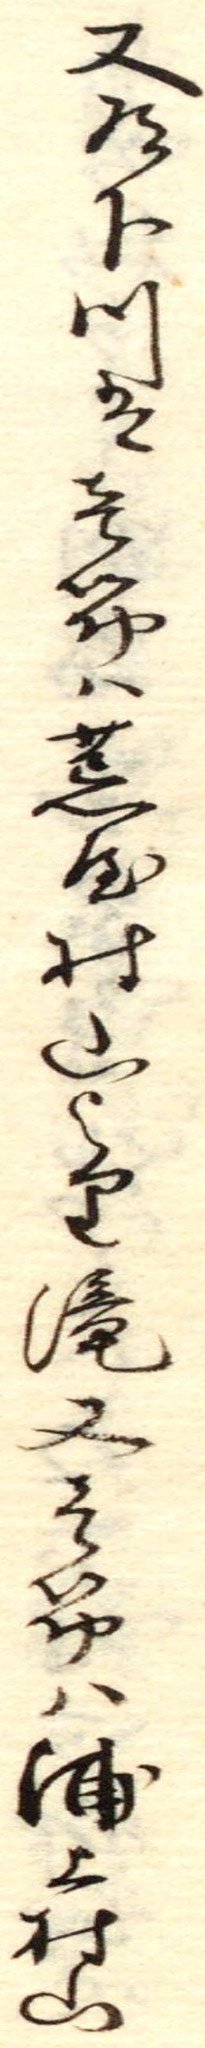又道下川は壱筋は荒屋村山より滝又壱筋は浦上村山
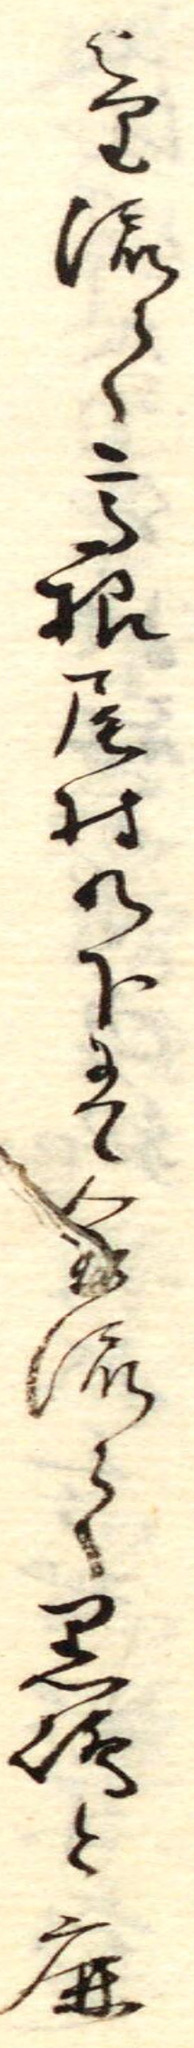より流て高根尾村の下にて流て黒嶋と鹿
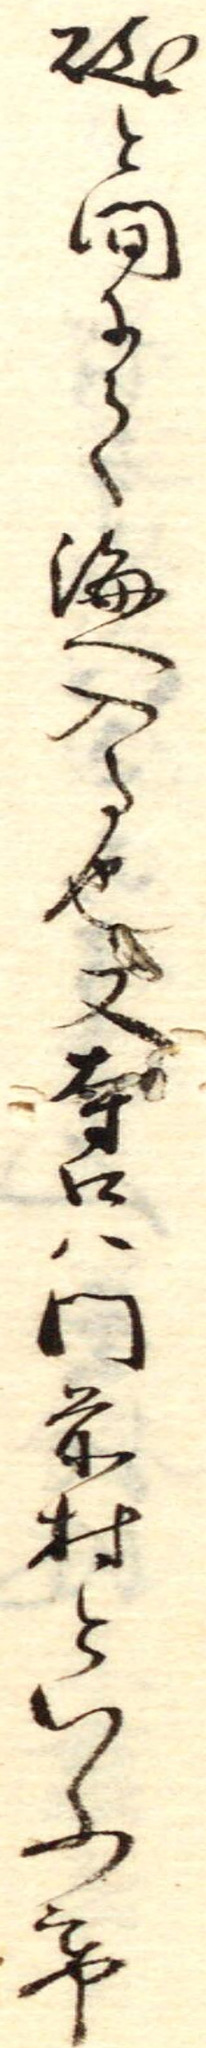礒と間にて海へ入る也又寺口は門前村といふけ
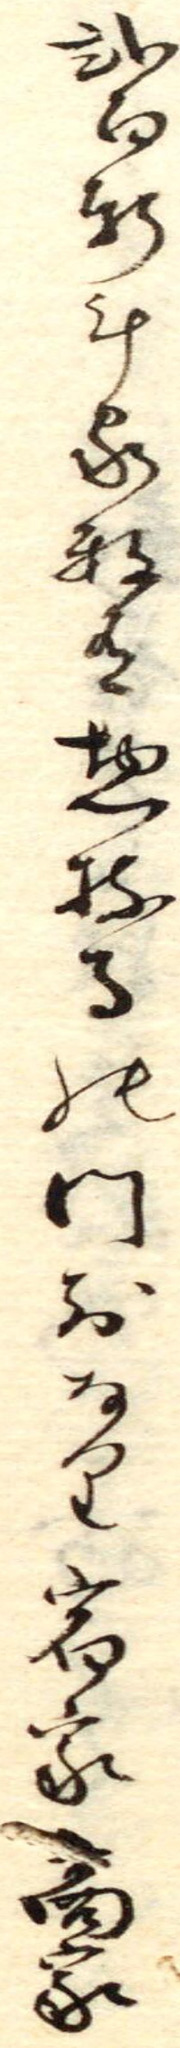弐百軒計家数有惣持寺の門前なり宿家商家
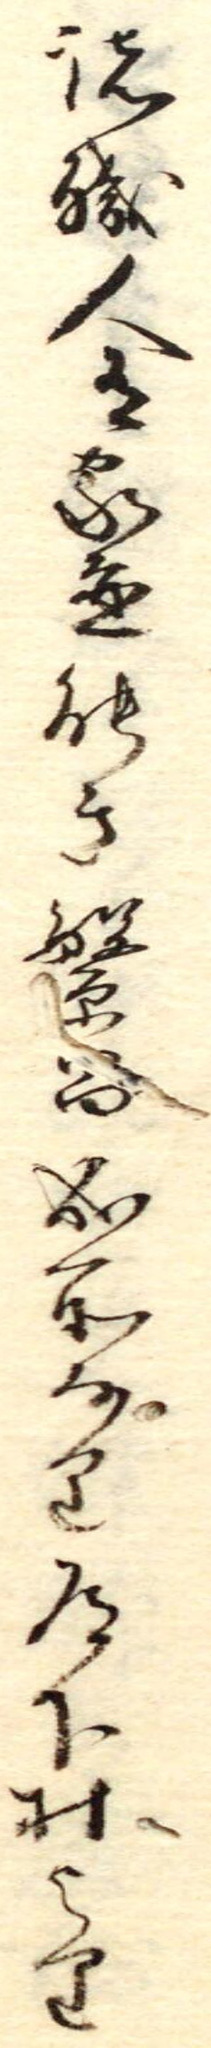諸職人有家並能き繁昌成所なり道下村より
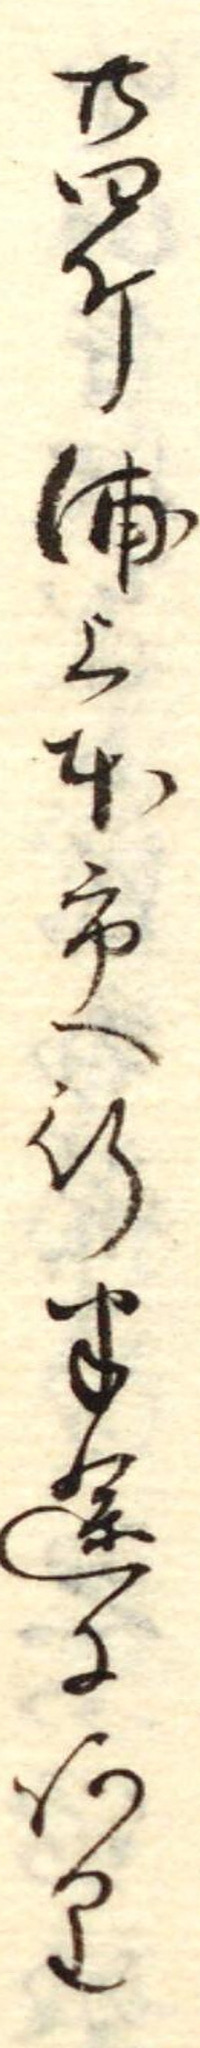廿四町浦上本市へ行半途にあり
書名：能登名跡誌
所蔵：Ishikawa Prefectural Library
